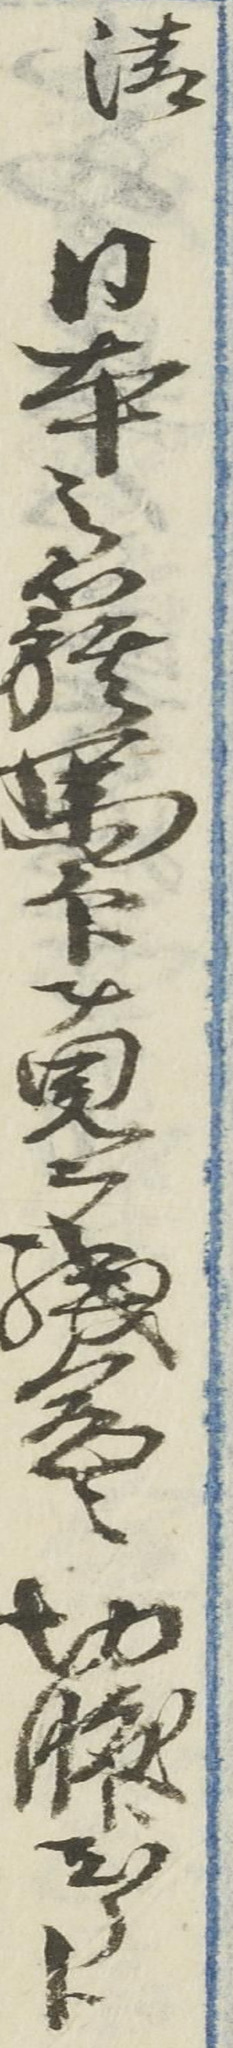清日本之籏馬印ヲ見テ残念也切腹ト云ウト
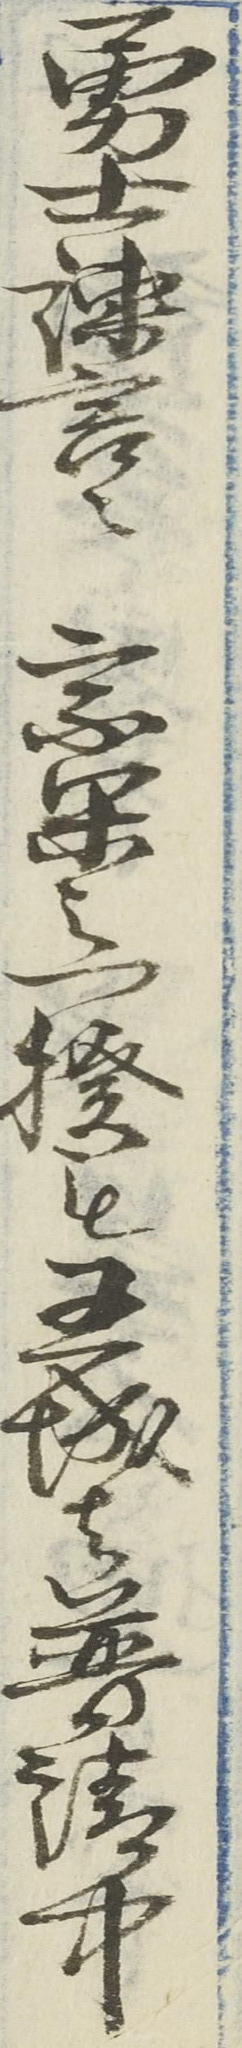勇士諌言ニ宗果之一揆も王城は普請中
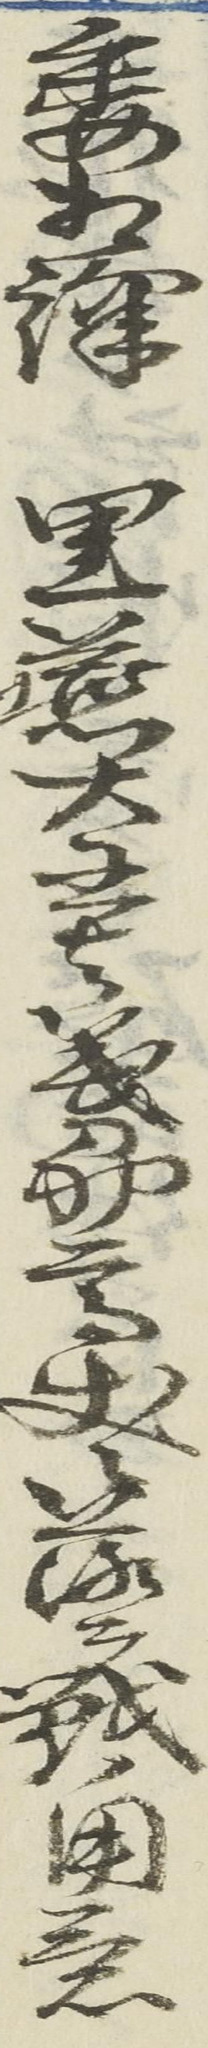委相譯里燕大王は義州高丈ニ落テ戦ノ用意
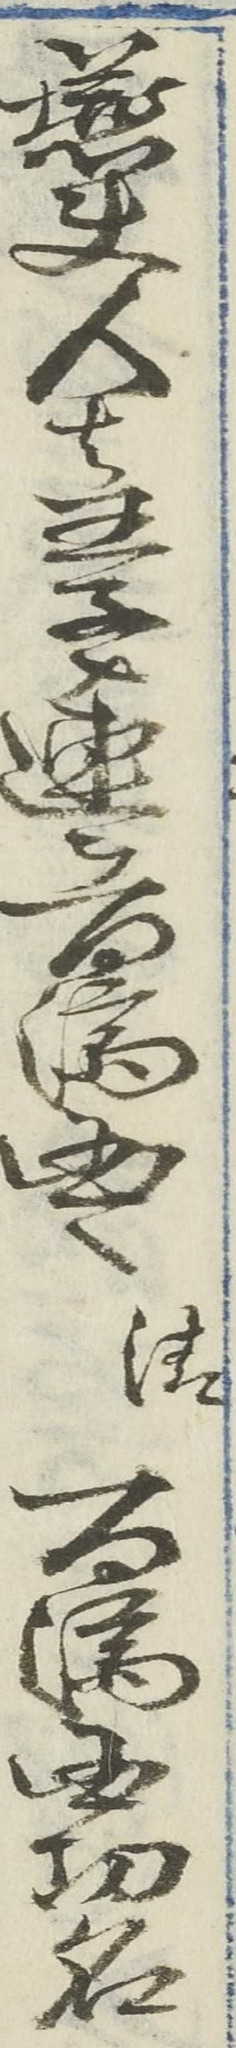燕夫人は王子ヲ連テ百済国ヘ清百済国功名
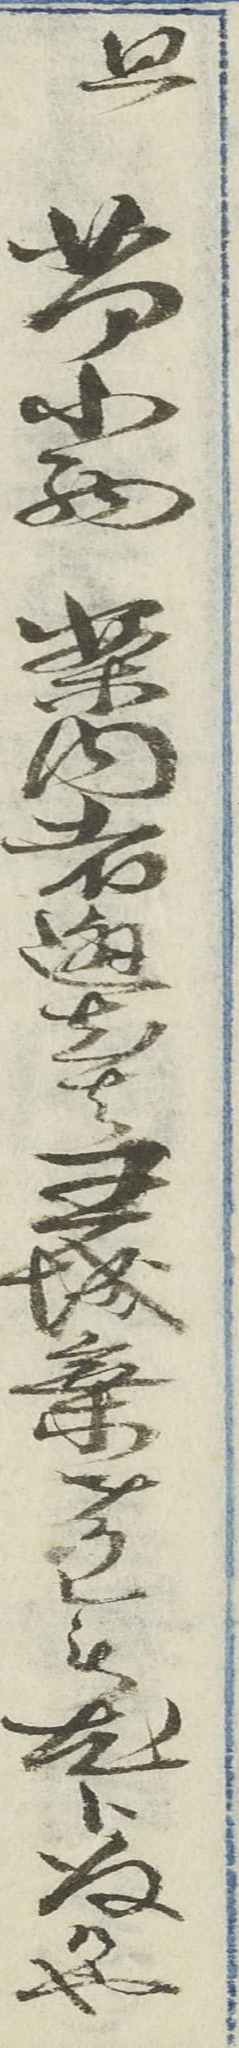且如何小西案内者逃去は王城乗ヲクレモ尤ト存ル也
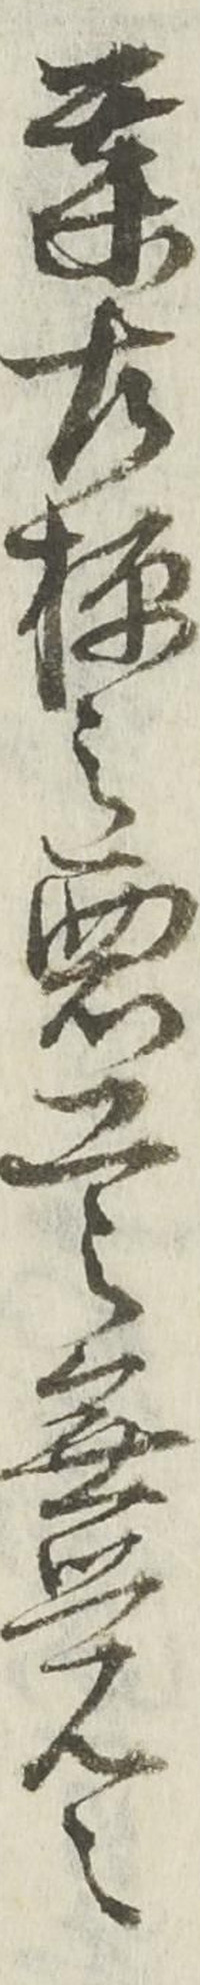小某左様之悪工之無覚ニ
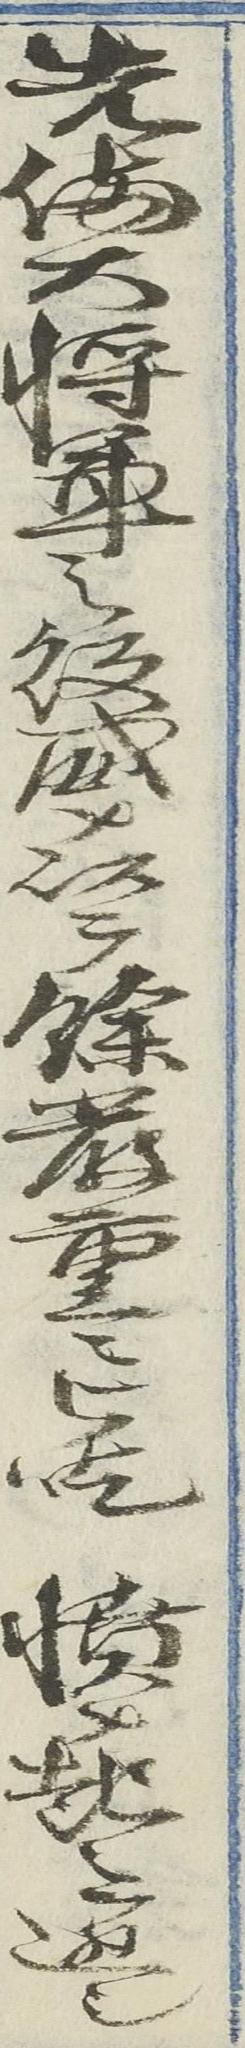先備大将軍之役成ヲ以テ餘厳重ニ被叱？憤ヲ起シテ逃シ
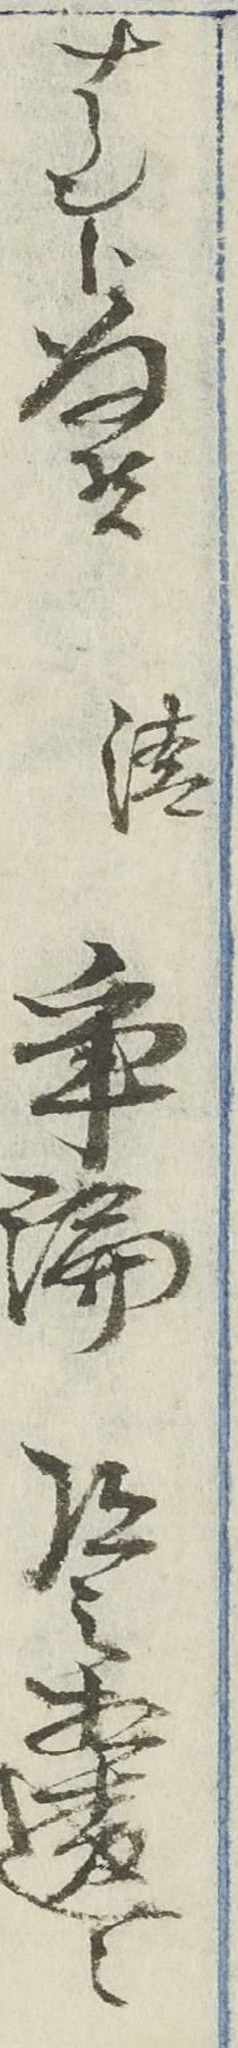ナラント存候清争論道之相違也
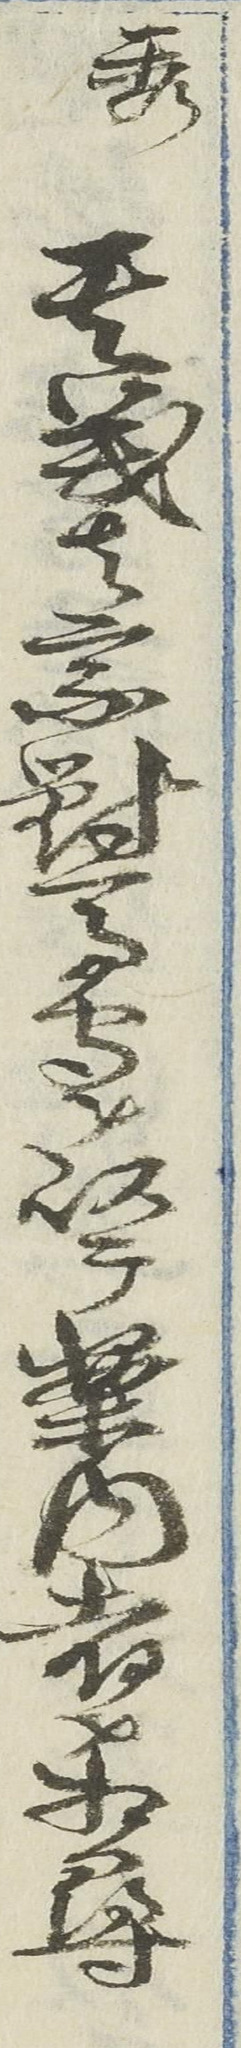秀其義は宗対馬守ヲ以テ案内者ヲ相尋
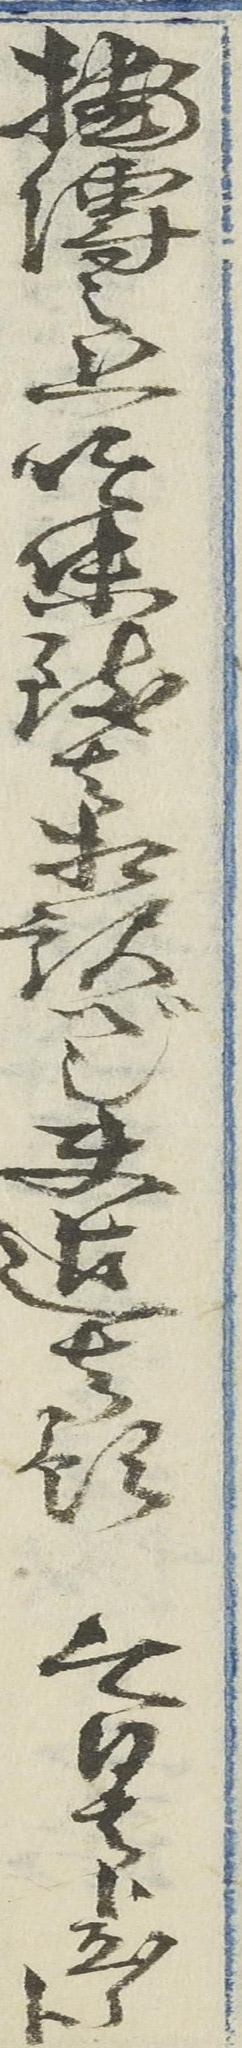捕傳之上吟味致は相訳ベシ夫迄は預今日はト云ウト
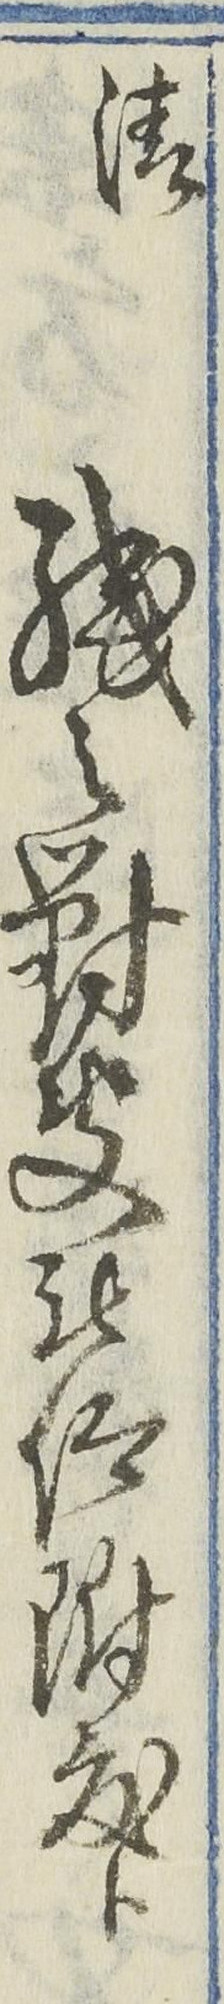清残之対決被仰附度ト
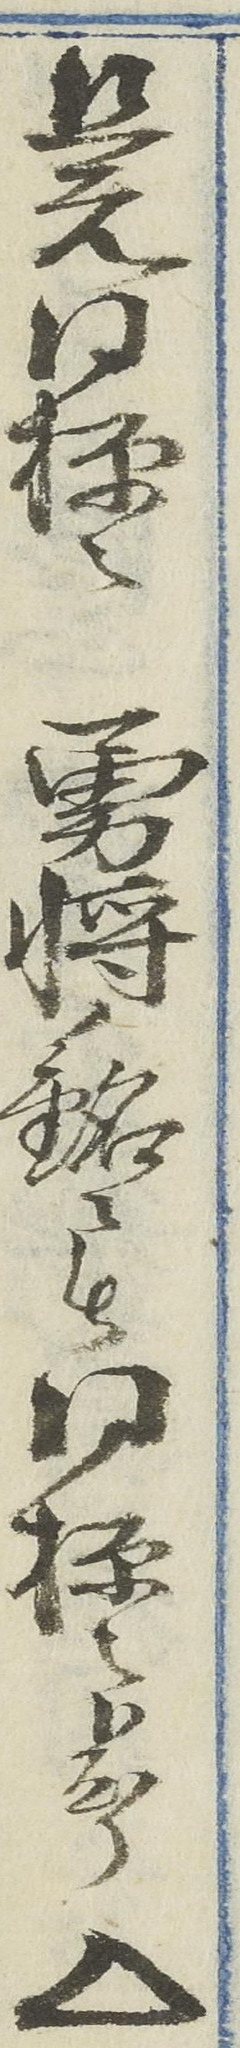且元同様ニ勇将ノ銘ニも同様ニト云ウ△

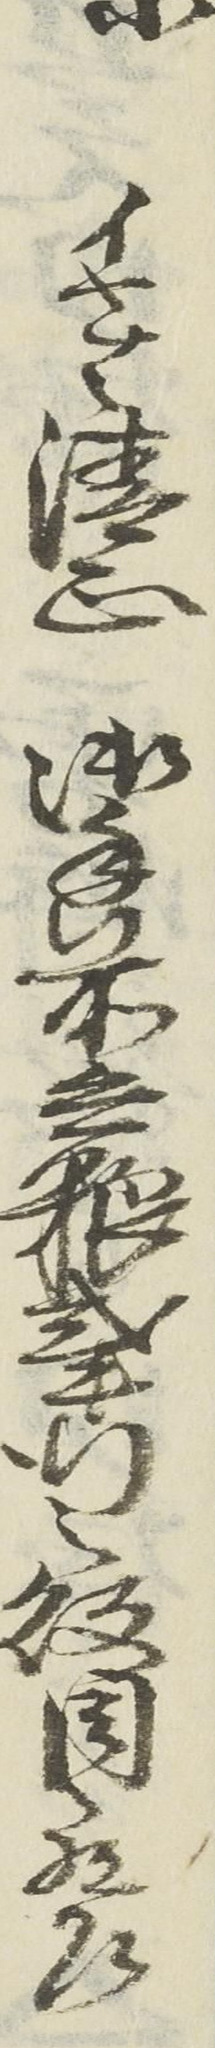小イヤナシ清正御手前兵粮奉行之役目二有乍
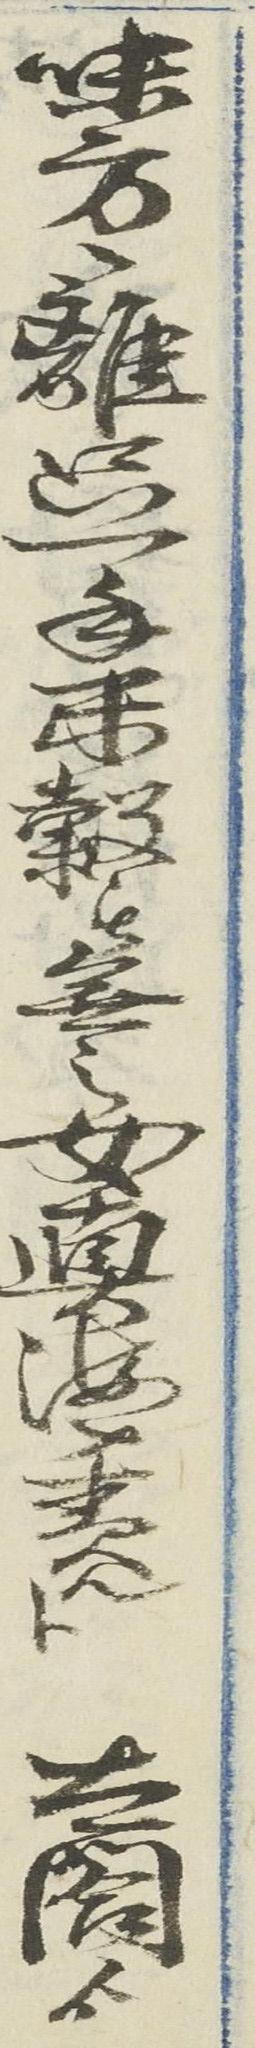味方ニ離只一手米穀も無之女真海ヲ責んト太閤ゟ
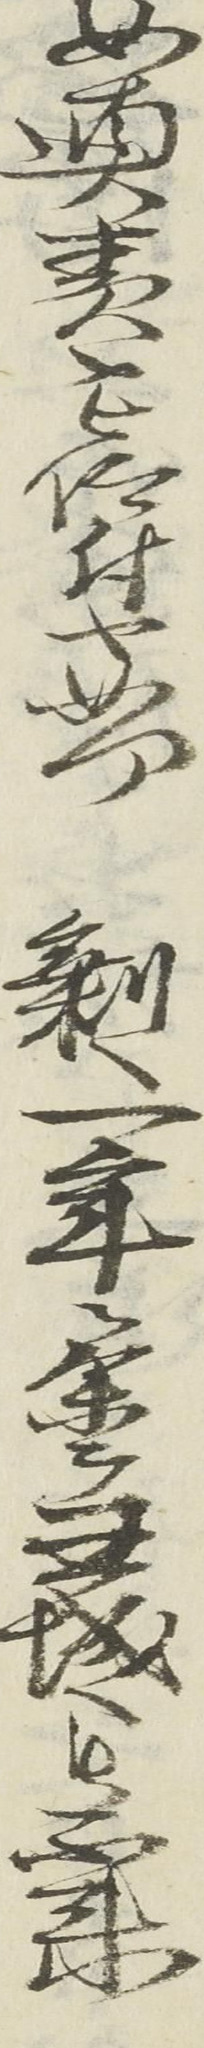女真責ヲ被仰付ヤ如何剰ヘ一年之余ヲ王城ヘも不来
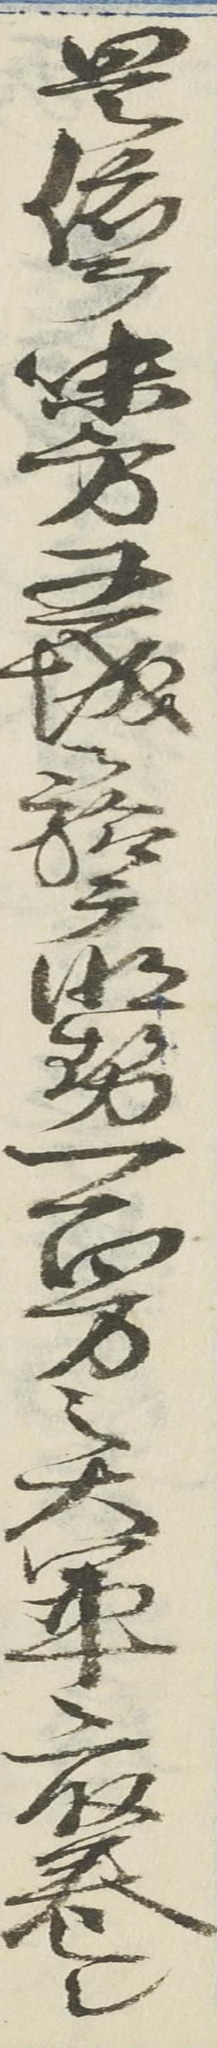是依テ味方王城二於テ明勢一百万之大軍二取巻レ
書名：伏水大地震
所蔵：東京大学地震研究所図書室 Earthquake Research Institute Library, The University of Tokyo, JAPAN
